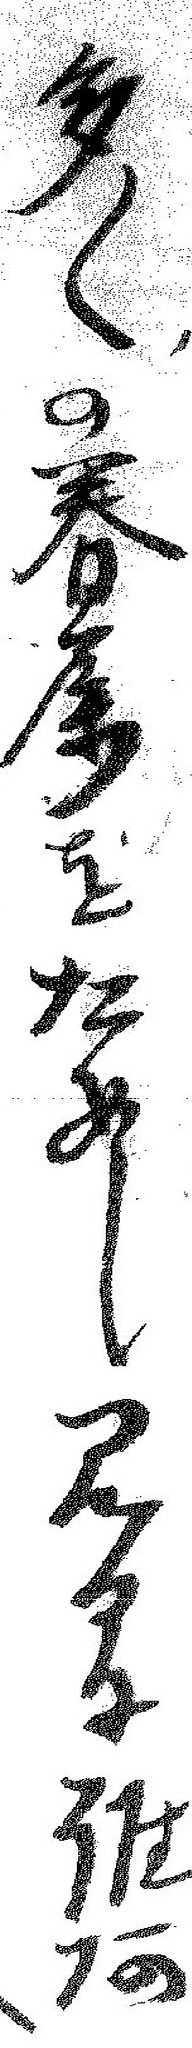多くの眷属をためし見るに誰あ
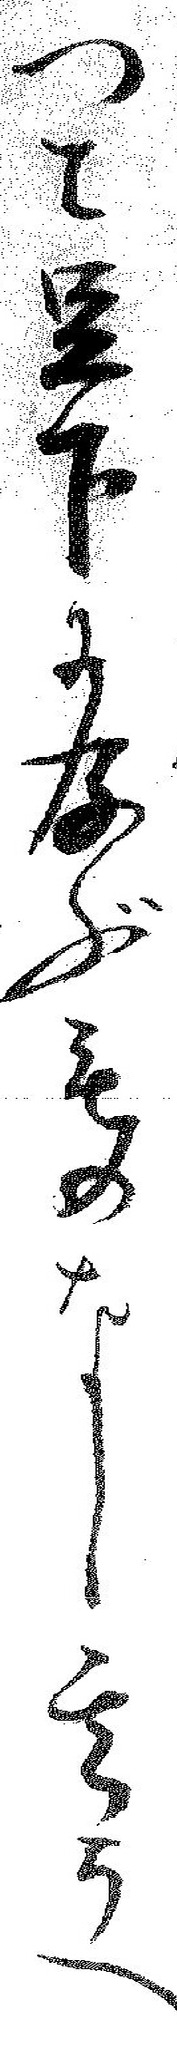つて足下に及ぶものなし其うへ
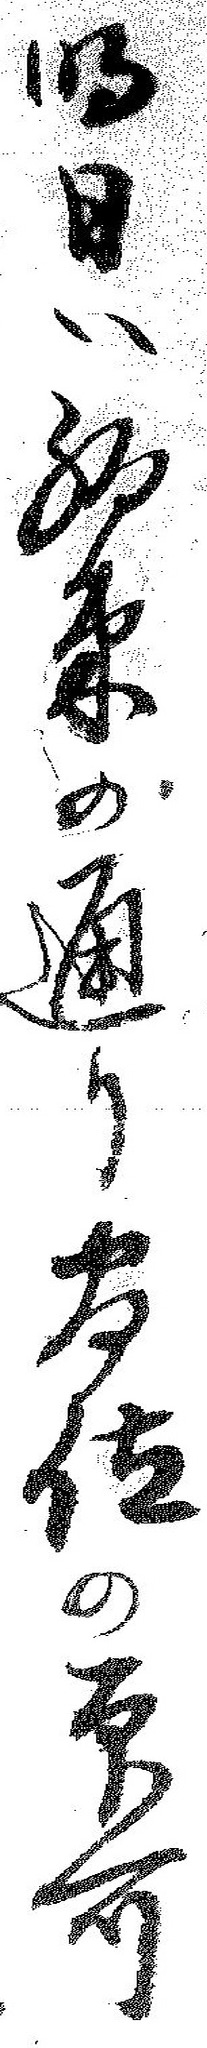明日は約束の通り官位の印可
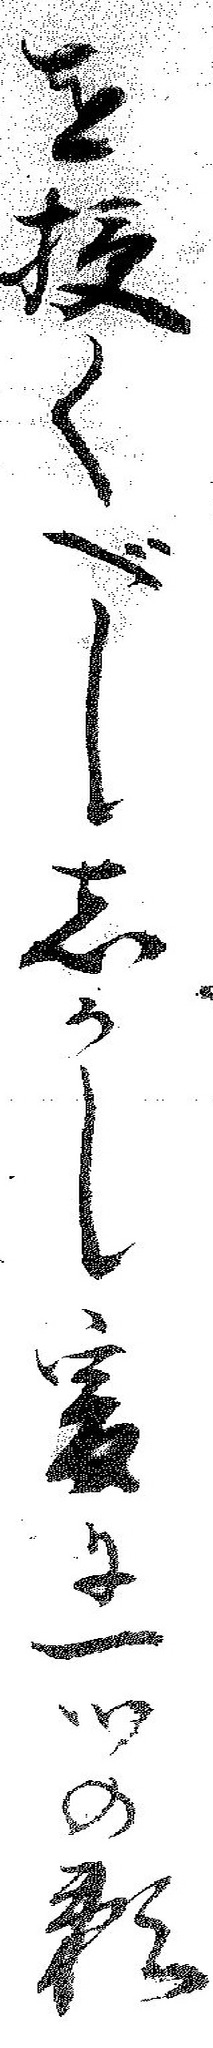を授くべししかし爰に一つの頼
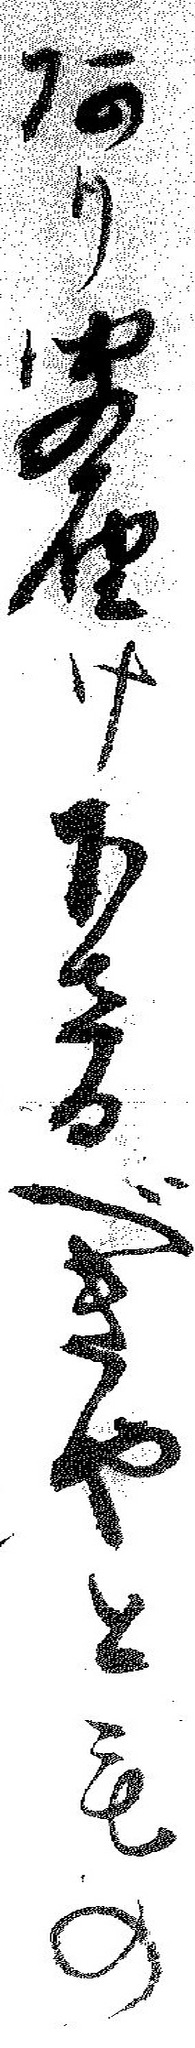あり聞届け下さるべきやともの
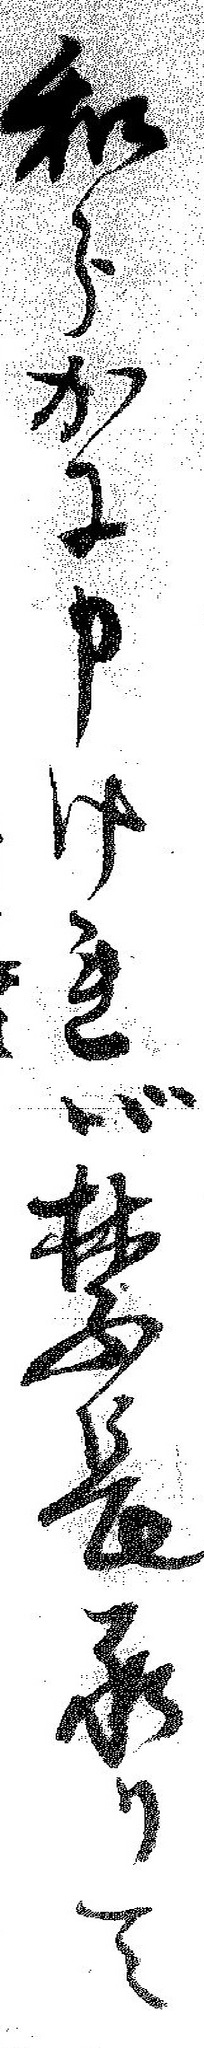和らかに申ければ禁長承りて
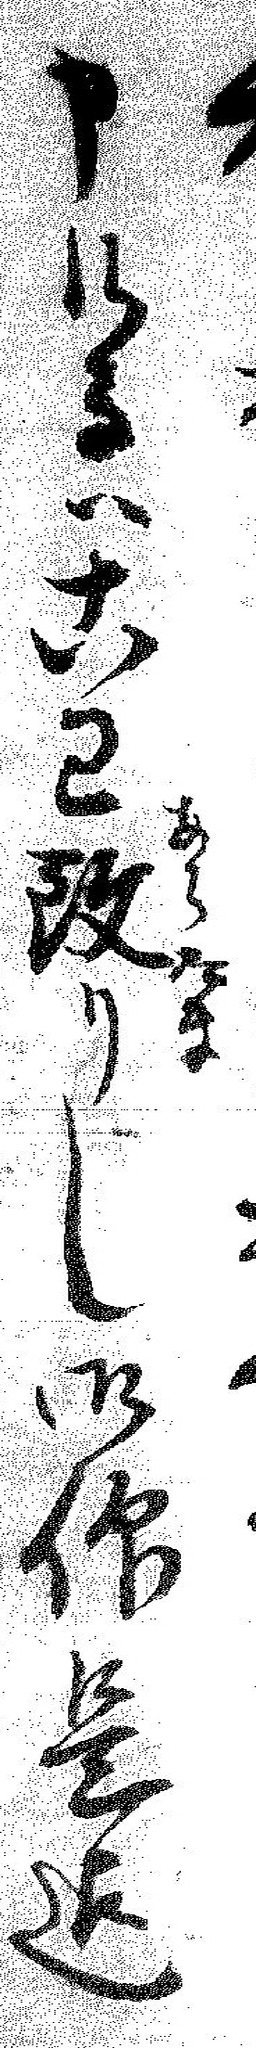申けるはこわ改りし御仰是迄

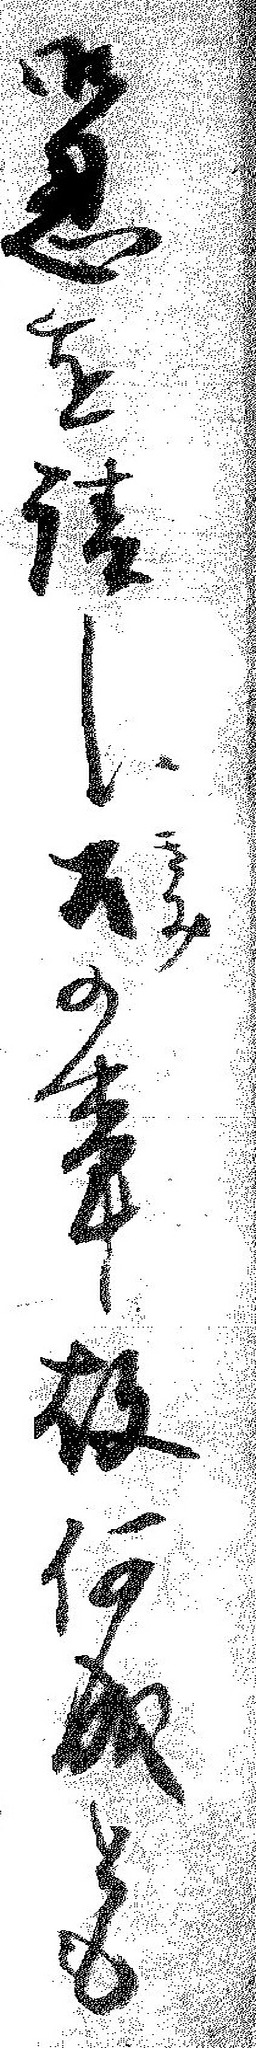御恩を請し公の事故何成とも
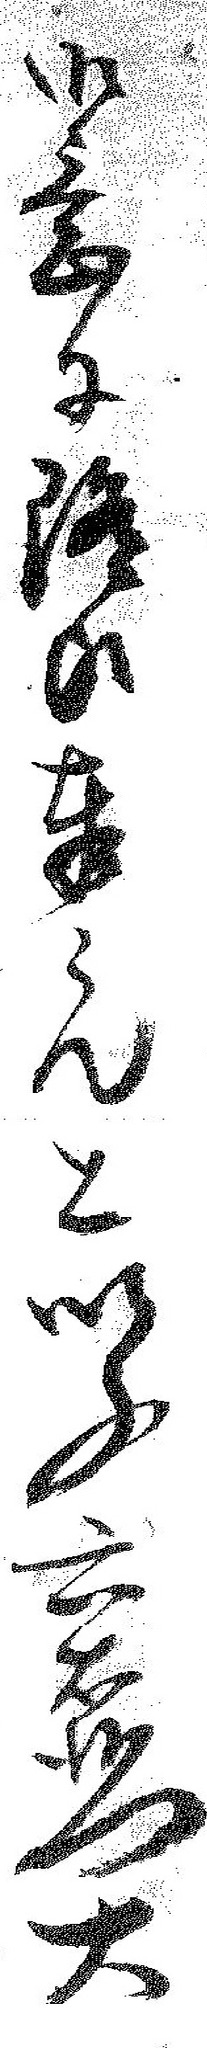御意に随ひ奉らんといふ六右衛門大
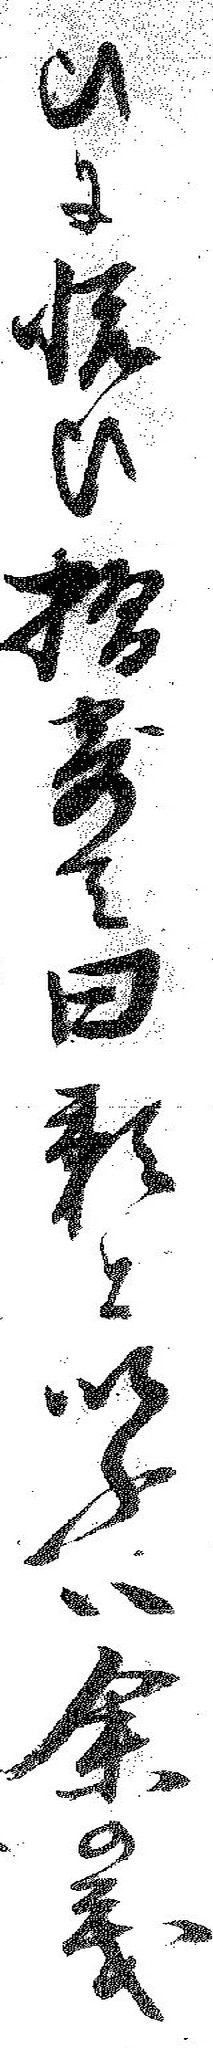ひに悦ひ摺寄て曰頼といふは余の義
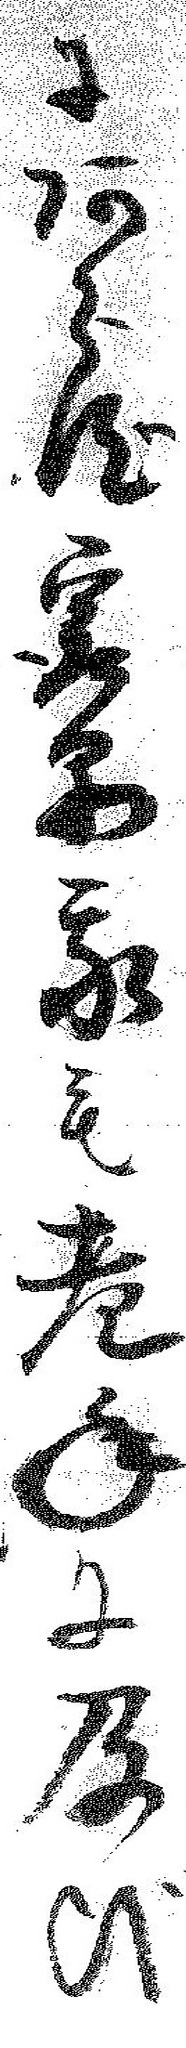にあらず最早我も老年に及び
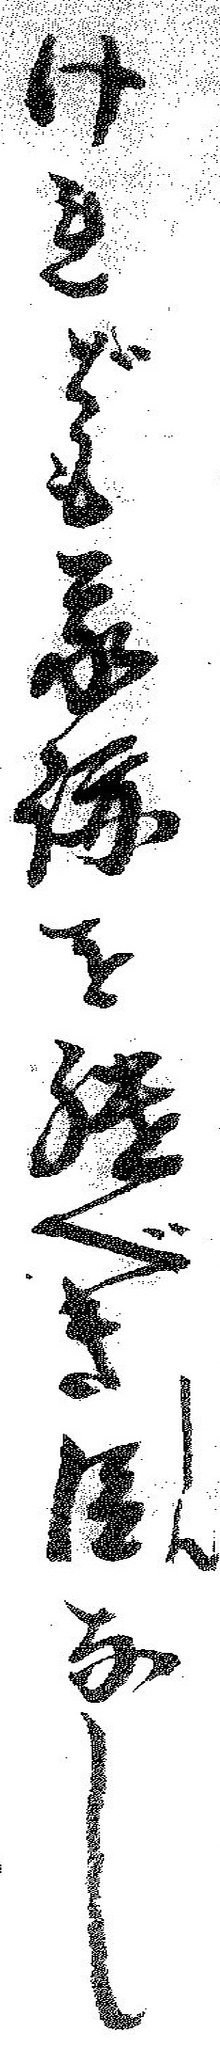けれども我跡を継べき臣なし
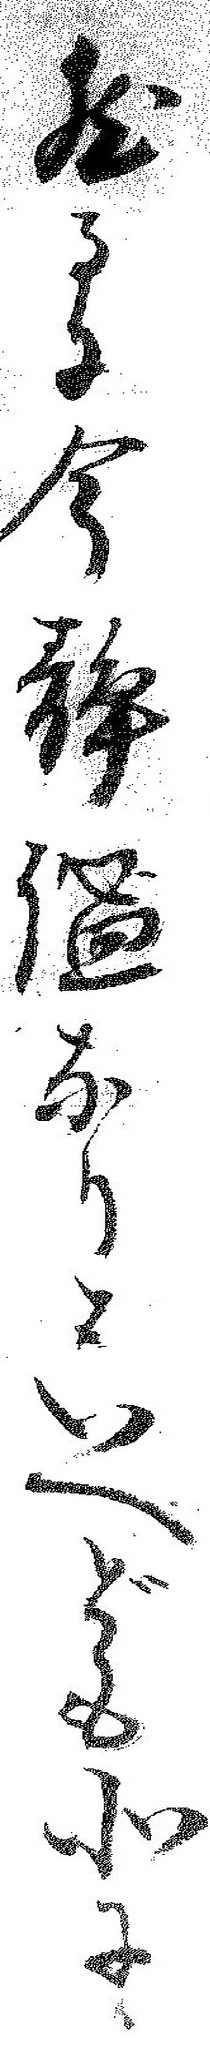然るに今静謐なりといへども北に
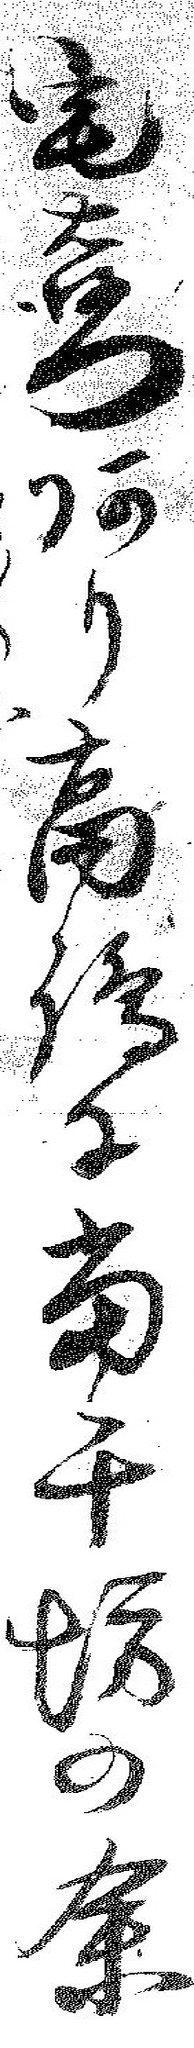宅右衛門あり高嶋に当千坊の余
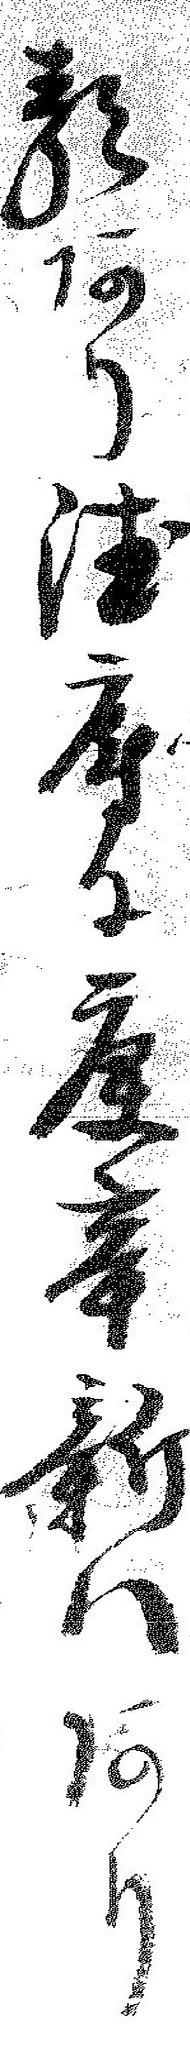類あり徳府に庚辛新八あり
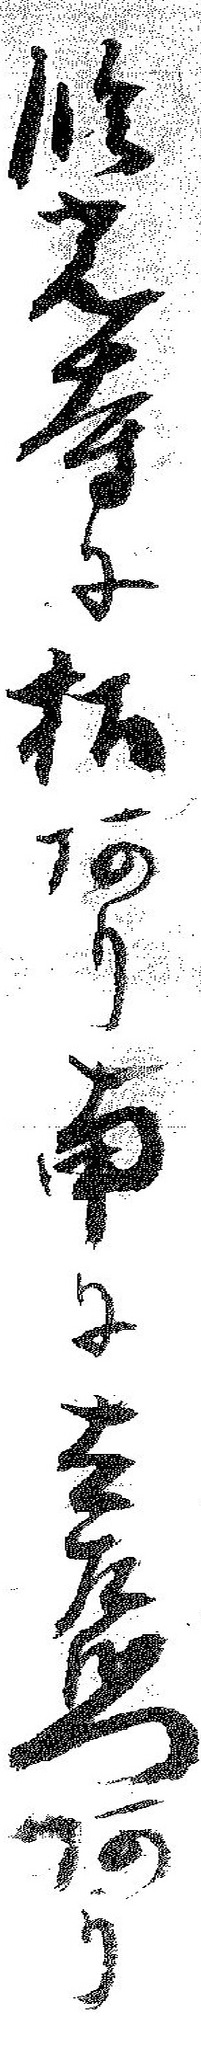臨光寺に柏あり南に太左衛門あり
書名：近頃古狸珍説　礼義智信
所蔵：徳島県立図書館
